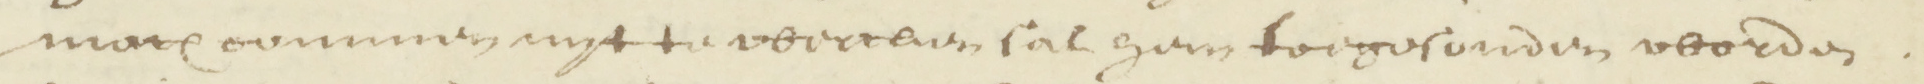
mach commen uyt te wercken sal hem toegesonden worden .
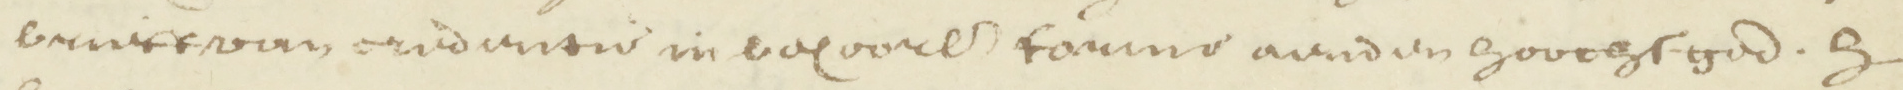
brieff van credentie in behoorl forme aenden hoochsged. H
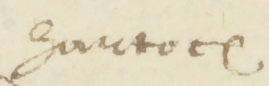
hartoch
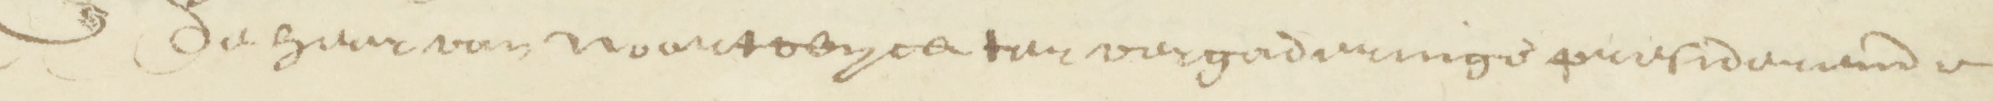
De heer van Noortwyck ter vergaderinge presiderende
